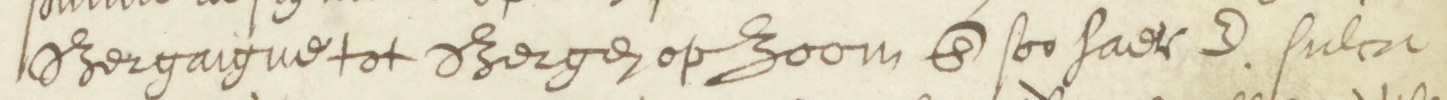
Bergaigne tot Bergen op Zoom & soo haer E. sulcx
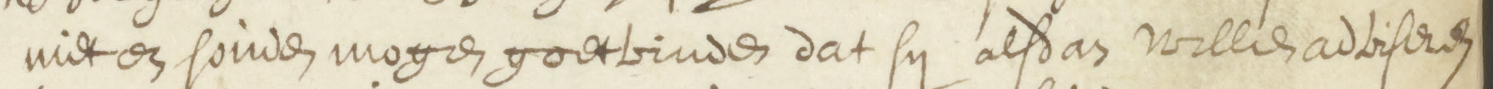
niet en souden mogen goetvinden dat sy alsdan willen adviseren
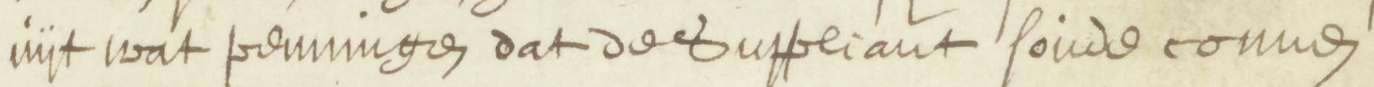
uijt wat penningen dat de Suppliant soude connen
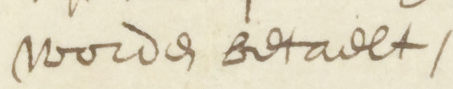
worden betaelt.
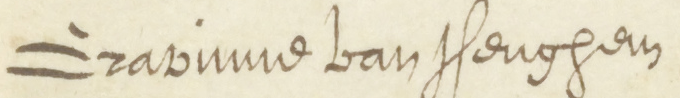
Gravinne van Isenghem
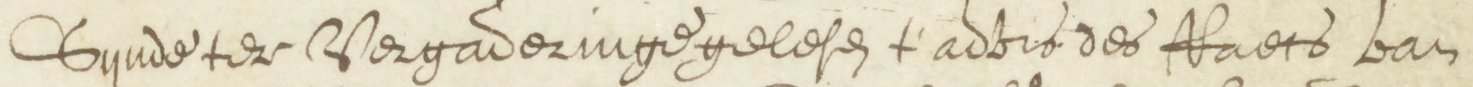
Synde ter Vergaderinge gelesen t'advis des Raets van
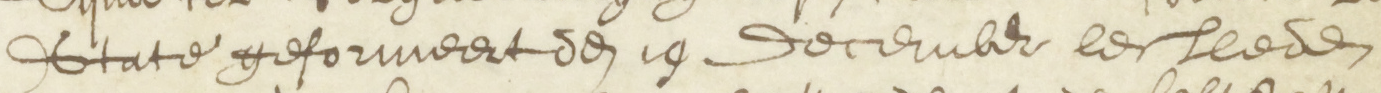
State geformeert den 19 December lestleden
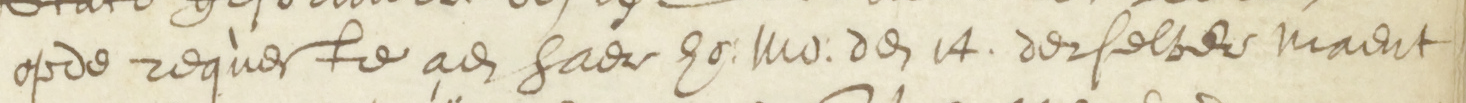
opde requeste aen haer ho:mo: den 14. derselver maent
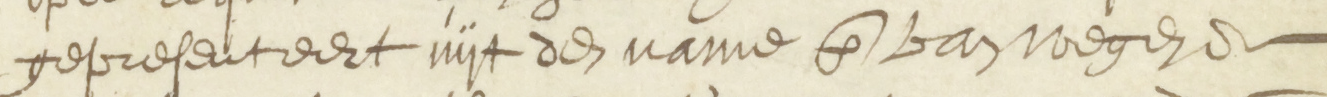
gepresenteert uijt den name & van wegen de
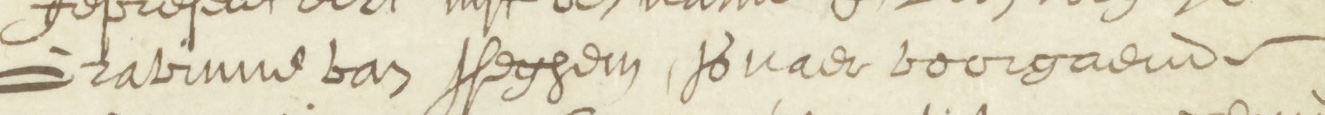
Gravinne van Iseghem. Is naer voorgaende
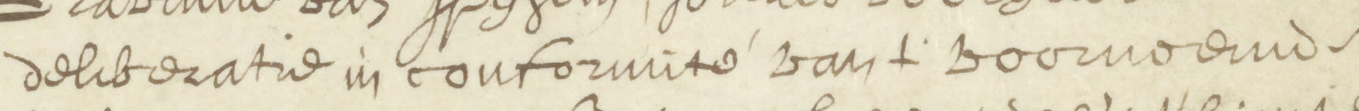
deliberatie in conformité van t' voornoemde
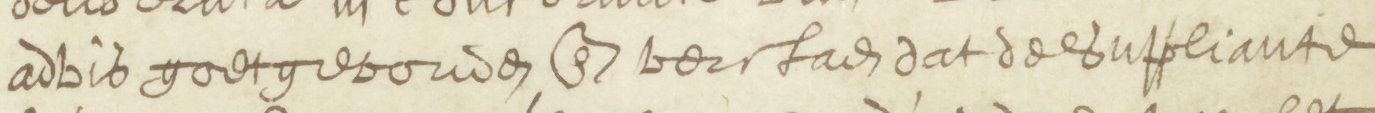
advis goetgevonden & verstaen dat de Suppliante
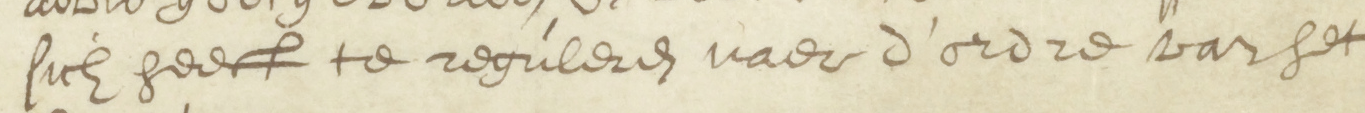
sich heeft te reguleren naer d'ordre van het
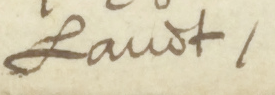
Landt.
